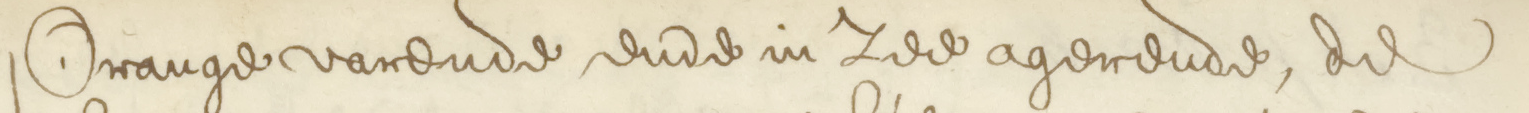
Orange varende ende in Zee agerende, de
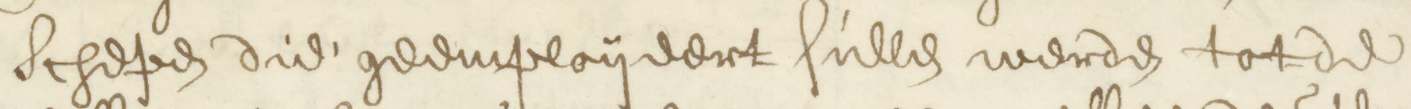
schepen die geemploijeert sullen werden tot de
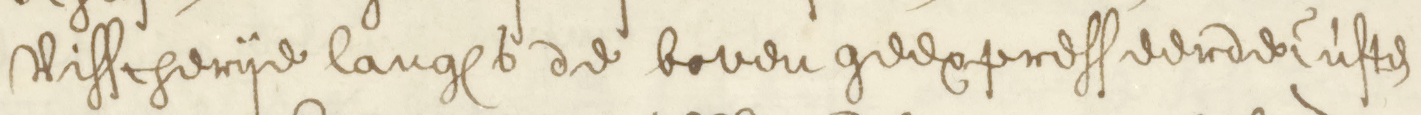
Visscherije langhs de boven geexpresseerde Custen
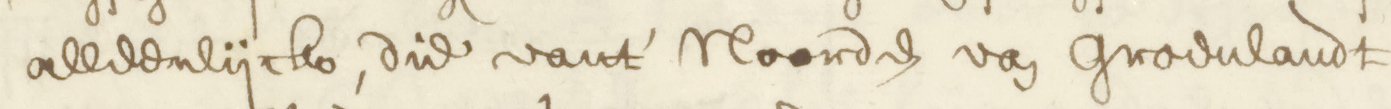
alleenlijck, die vant' Noorden van Groenlandt
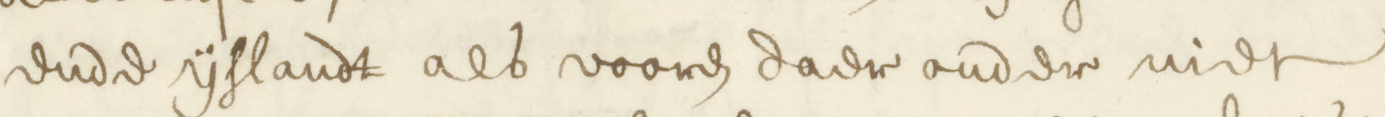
ende IJslandt als vooren daer onder niet
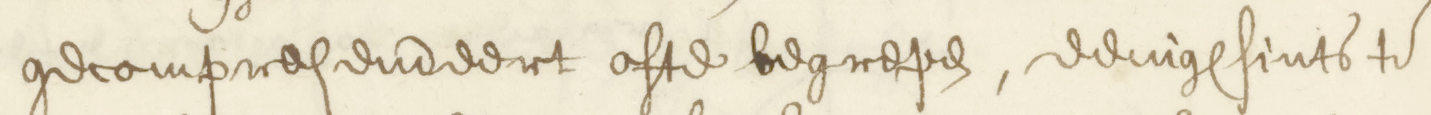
gecomprehendeert ofte begrepen, eenighsints te
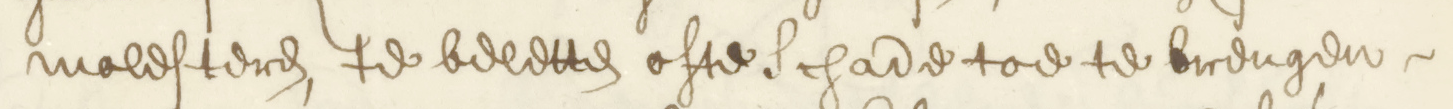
molesteren, te beletten ofte schade toe te brengen
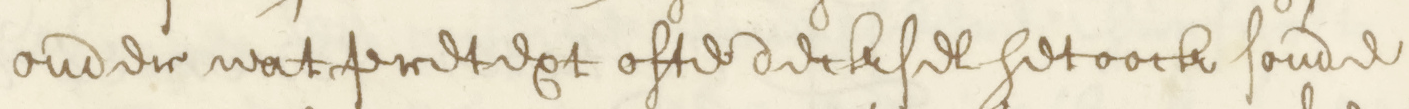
onder wat pretext ofte decksel het oock soude
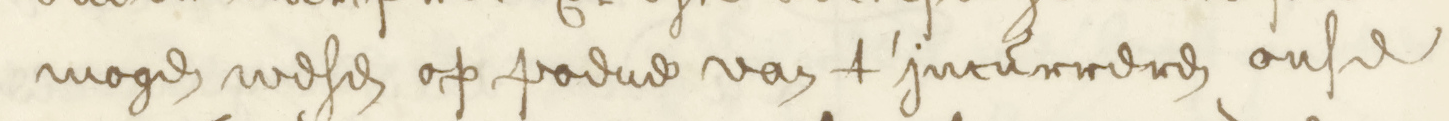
mogen wesen op poene van t' incurreren onse
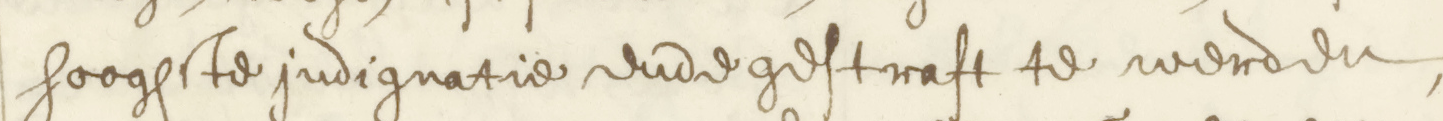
hooghste indignatie ende gestraft te werden,
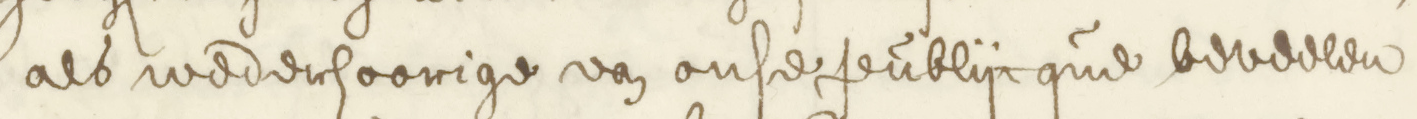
als wederhoorige van onse publijcque beveelen
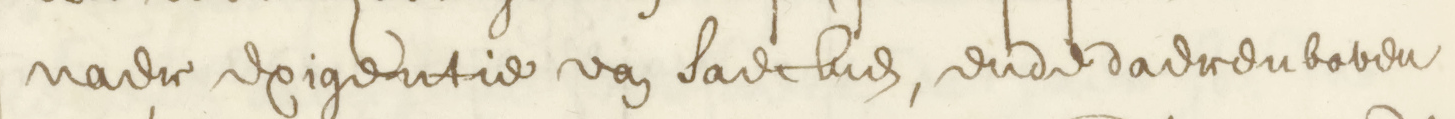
naer exigentie van saecken, ende daerenboven
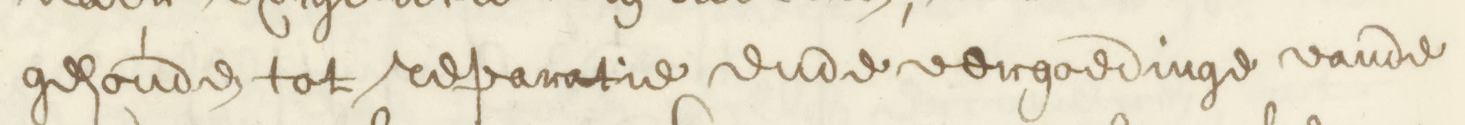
gehouden tot reparatie ende vergoedinge vande
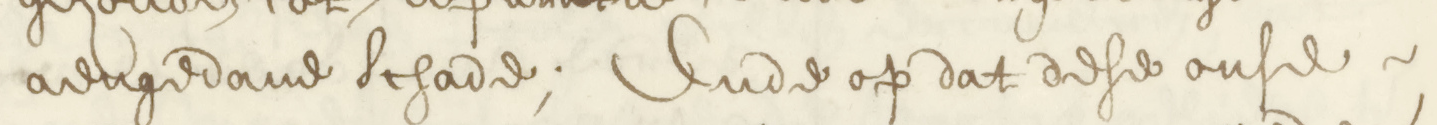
aengedane schade; Ende op dat dese onse
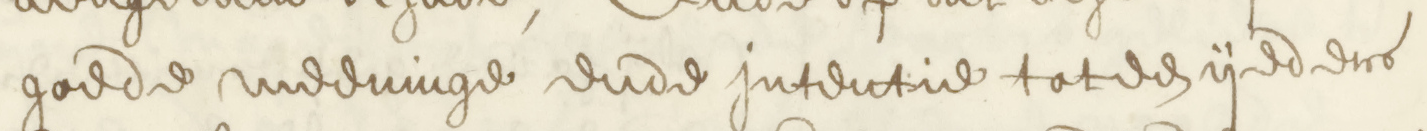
goede meeninge ende intentie tot een ijeders
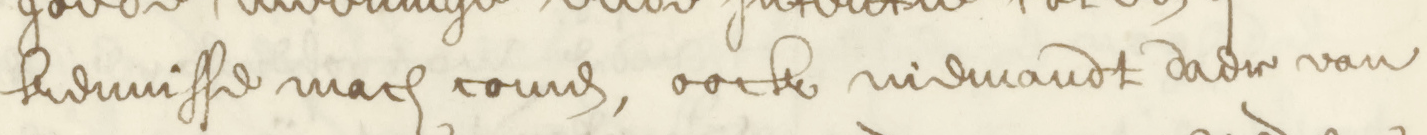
kennisse mach comen, oock niemandt daer van
